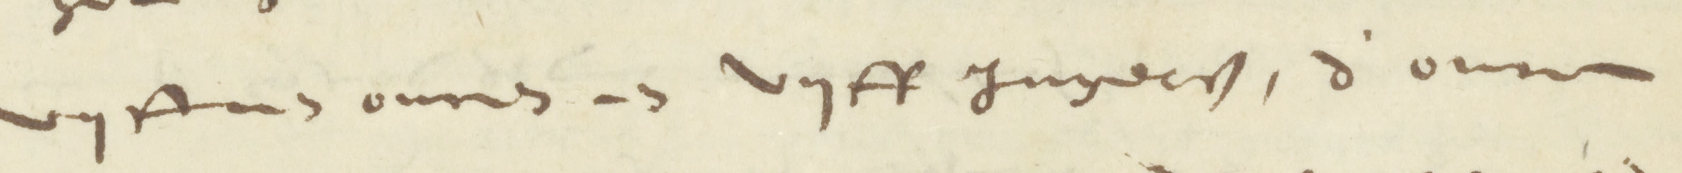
vyftien oncen en vijff Ingels, d'once
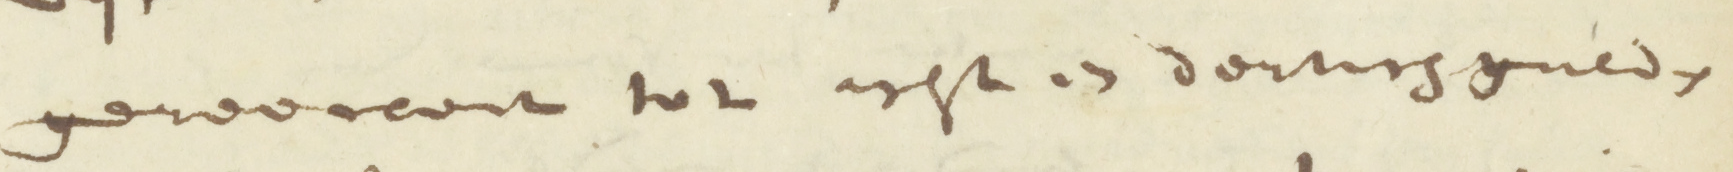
gereeckent tot acht en dertig gulden
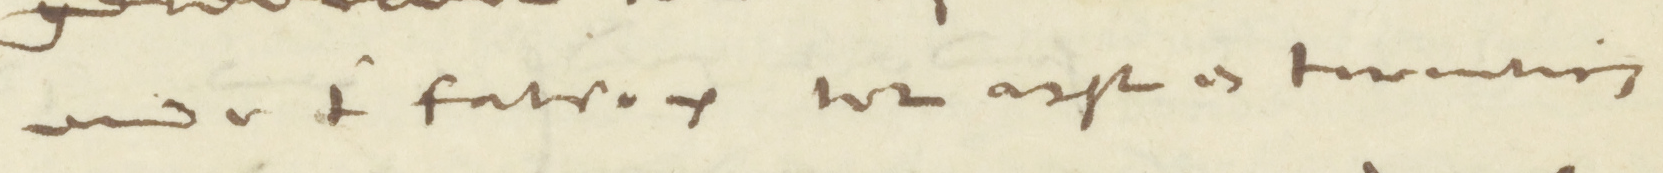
ende t' fatsoen tot acht en twintich
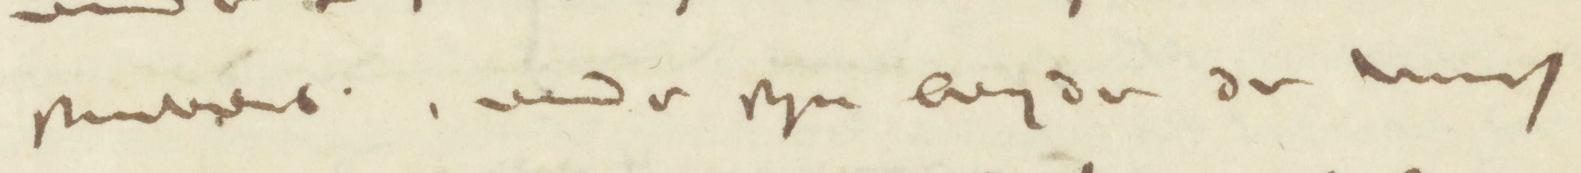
stuvers, ende syn byde de voors
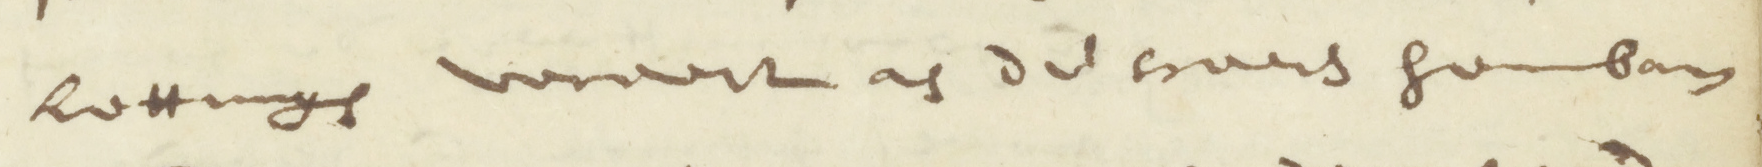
kettingen vereert aen de heren Hembach
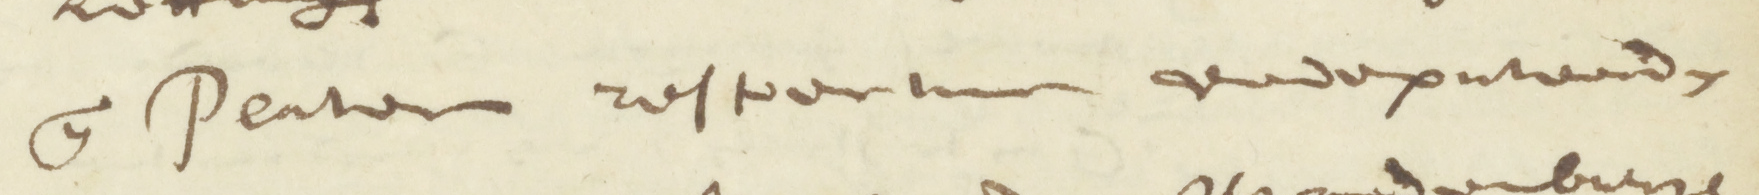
& Plater respective gedeputeerden
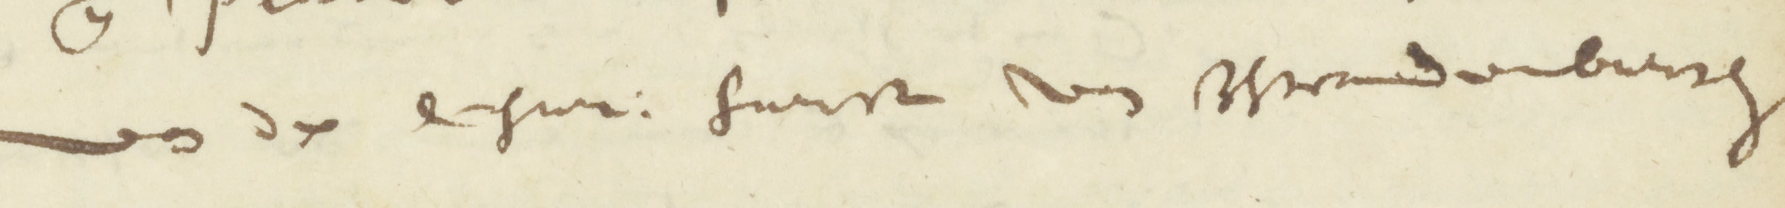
van den chur: furst van Brandenburch
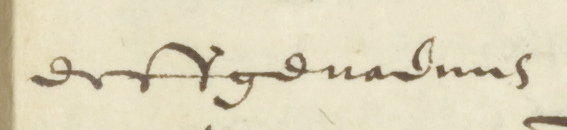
erffgenaemen
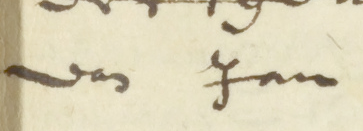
van Jan
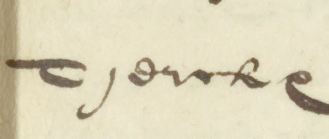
Tjerckx
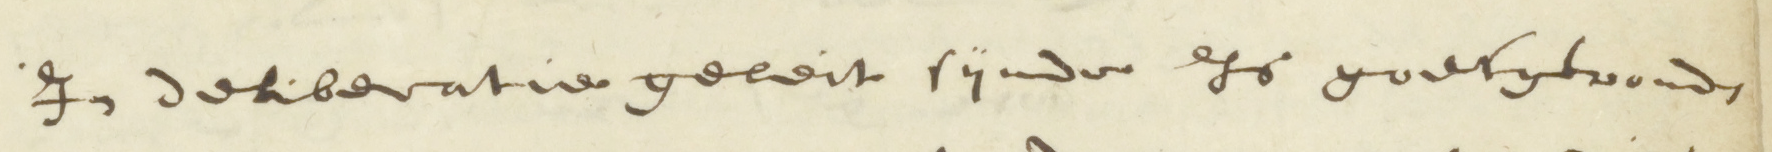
In deliberatie geleit sijnde is goetgevonden
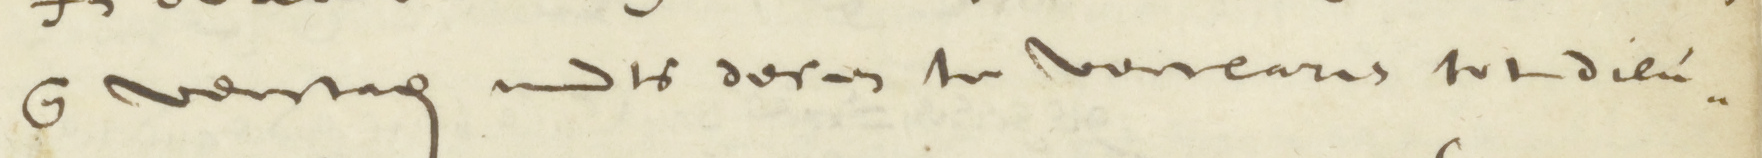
& verstaen mits desen te verclaren tot dilu,,
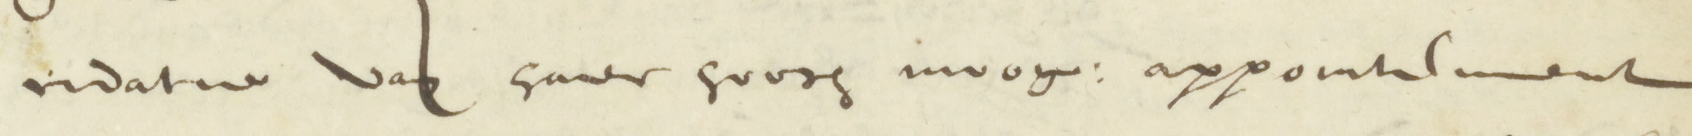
cidatie van haer hooch moog: appointement
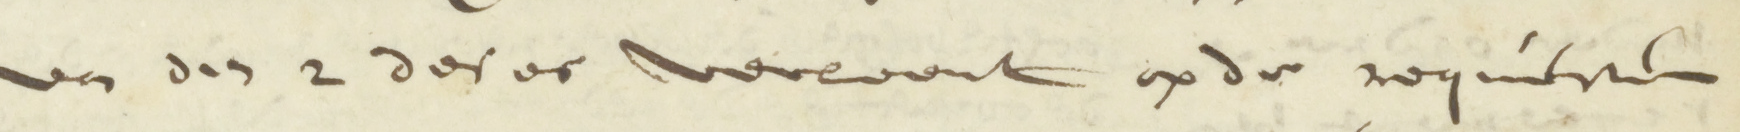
van den 2 deses verleent op de requeste
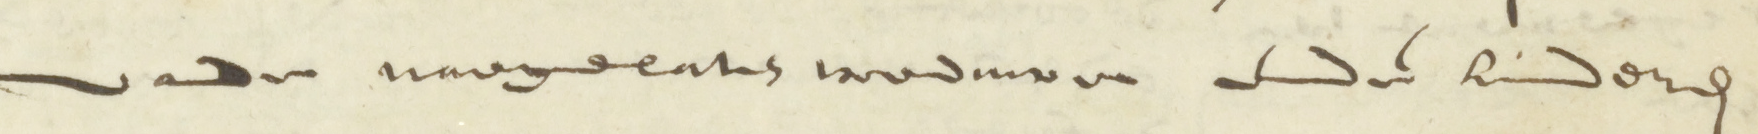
van de naegelaten weduwe ende kinderen
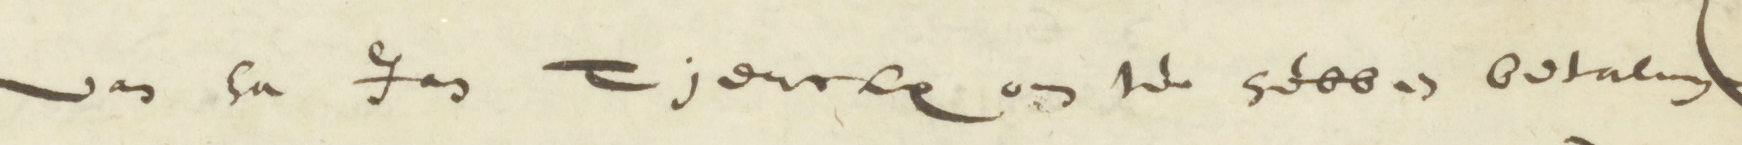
van sa Jan Tjerckx om te hebben betalinge
